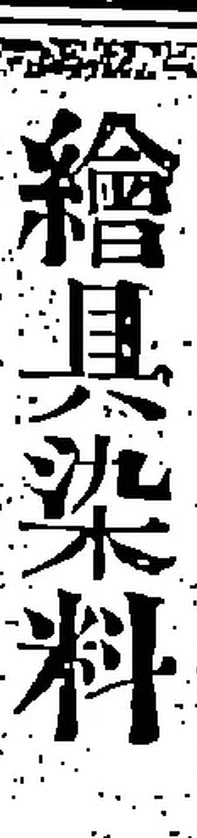絵具染料
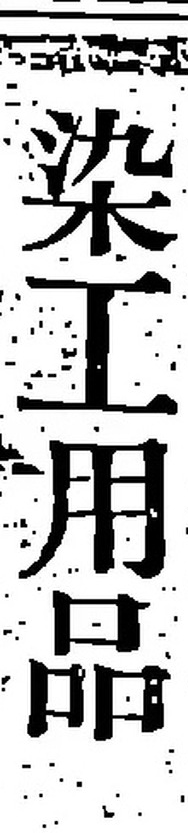染工用品
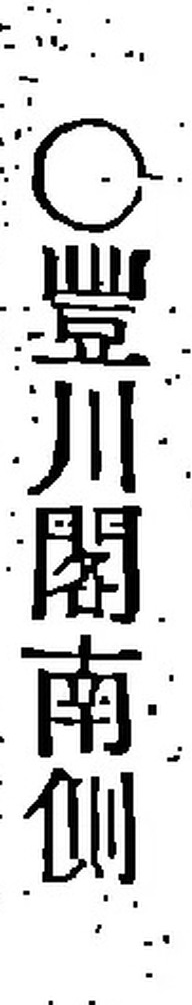○豊川閣南側
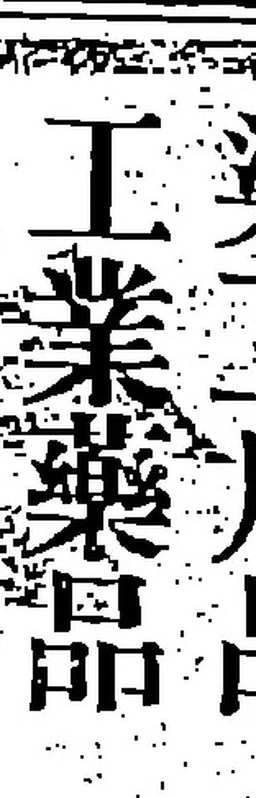工業薬品
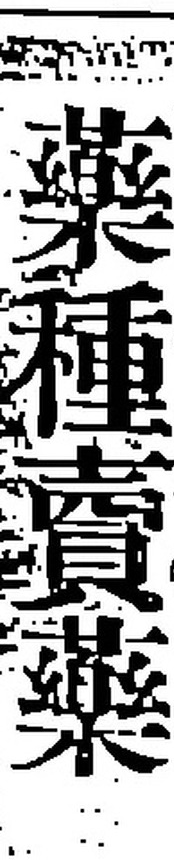薬種売薬
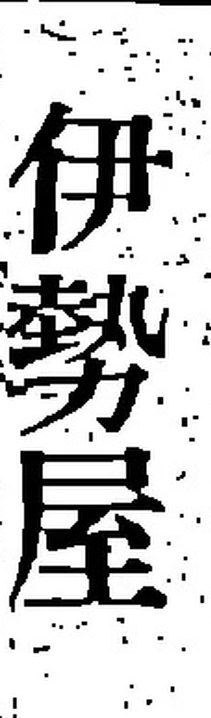伊勢屋
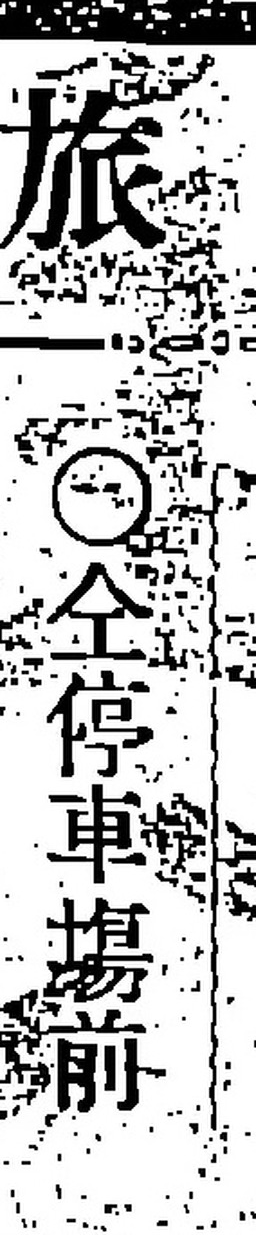○仝停車場前
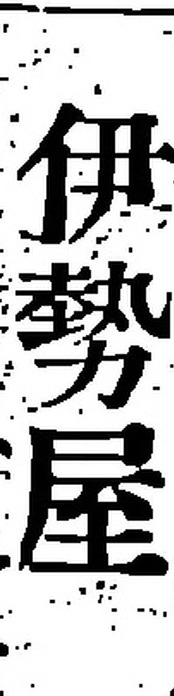伊勢屋
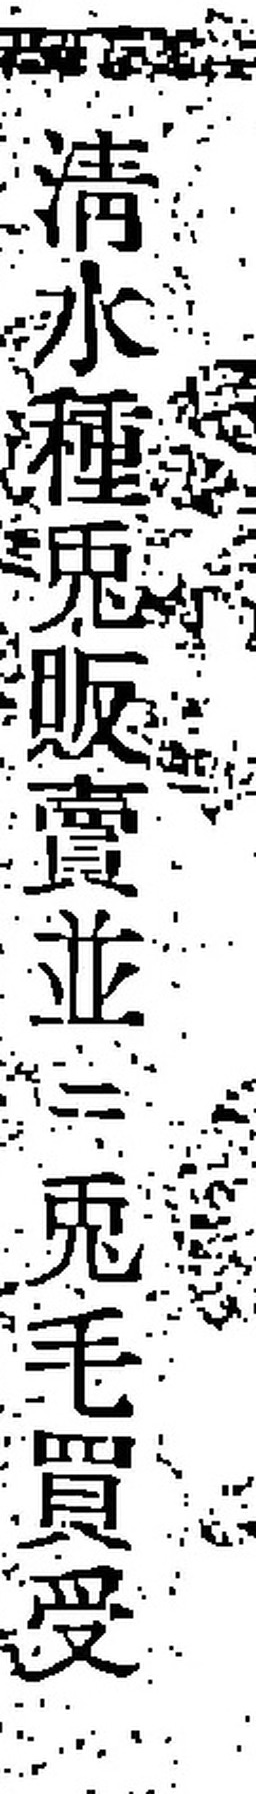清水種兎販売並ニ兎毛買受
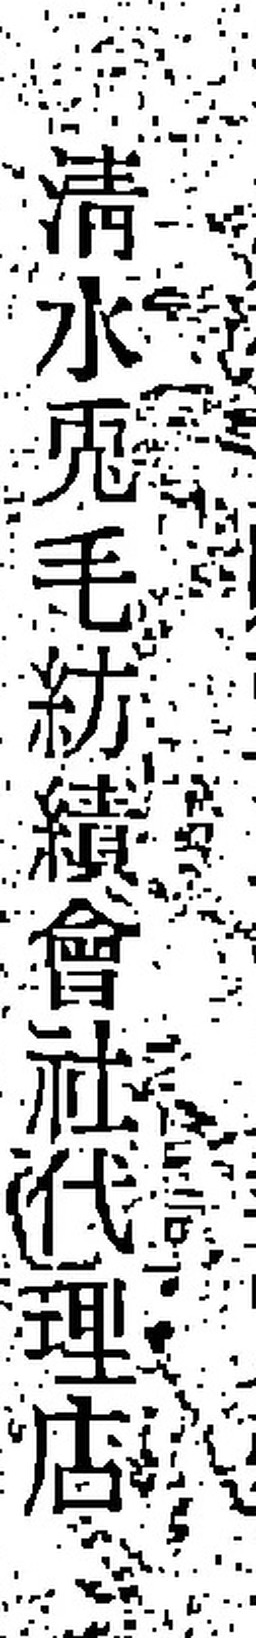清水兎毛紡績会社代理店
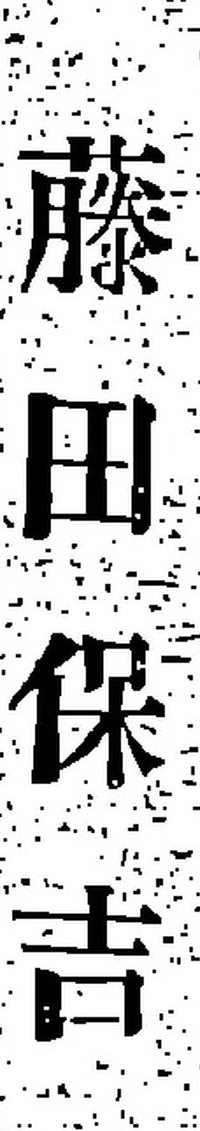藤田保吉
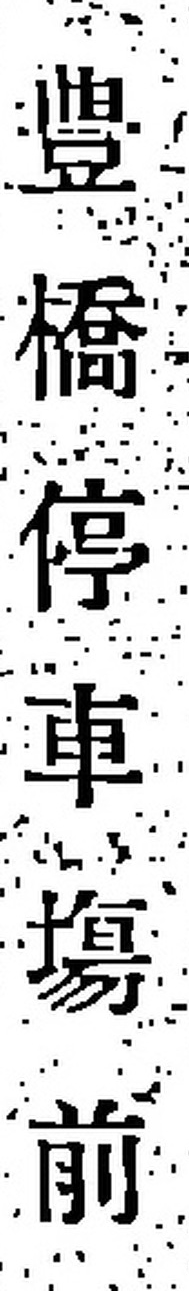豊橋停車場前
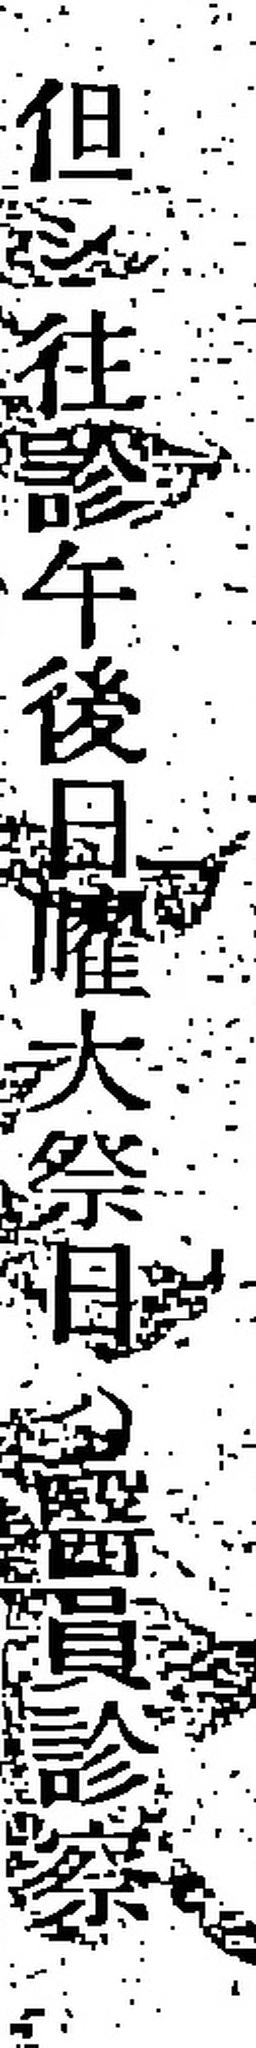但シ往診午後日曜大祭日ハ医員診察
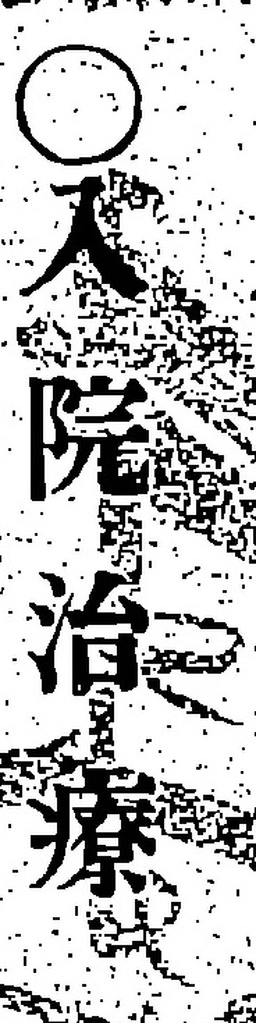○入院治療
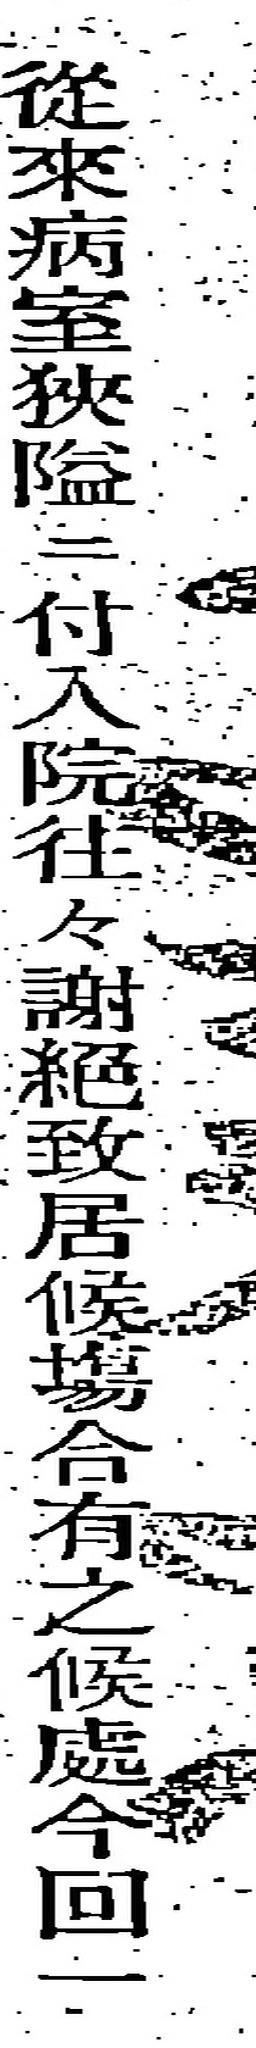従来病室狭隘ニ付入院往々謝絶致居候場合有之候処今回一
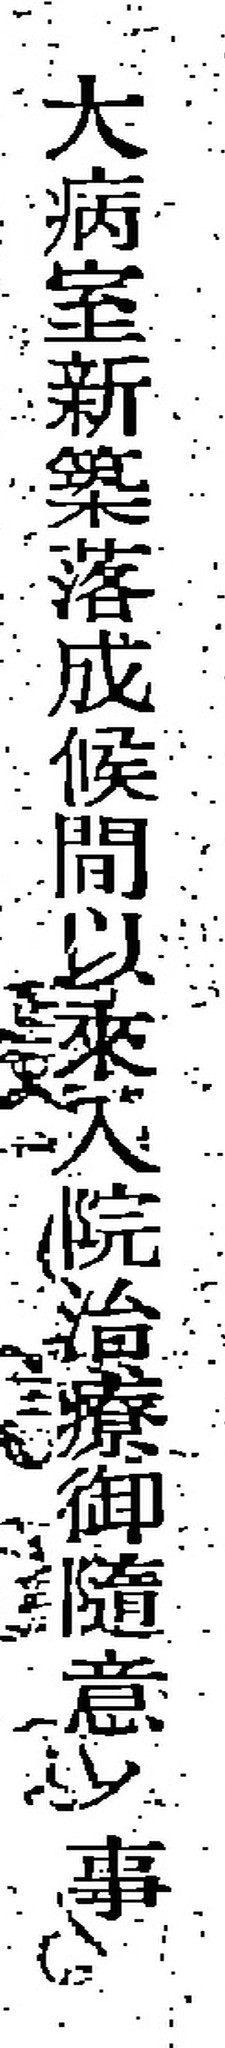大病室新築落成候間以来入院治療御随意ノ事
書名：東参名勝案内
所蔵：国立国会図書館 National Diet Library, JAPAN
